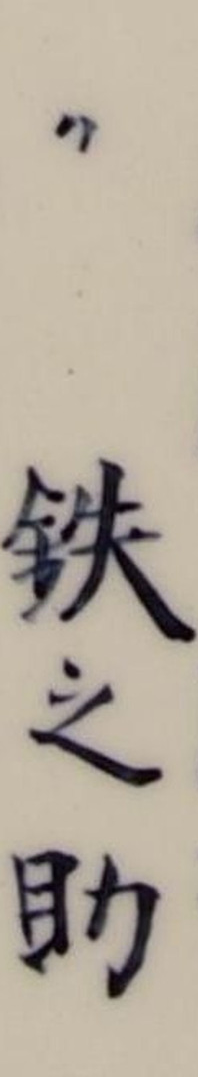鉄之助
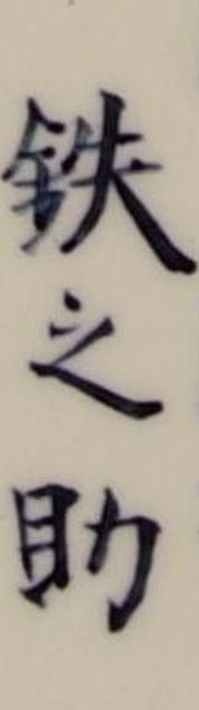鉄之助
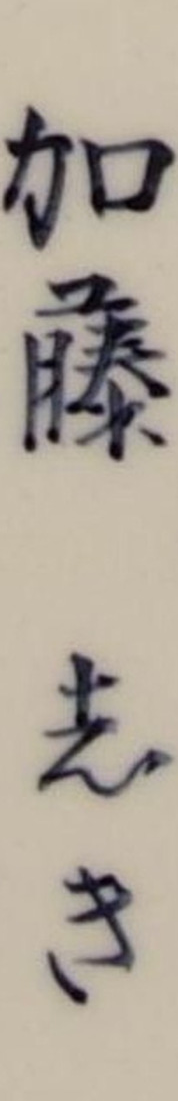加藤しき
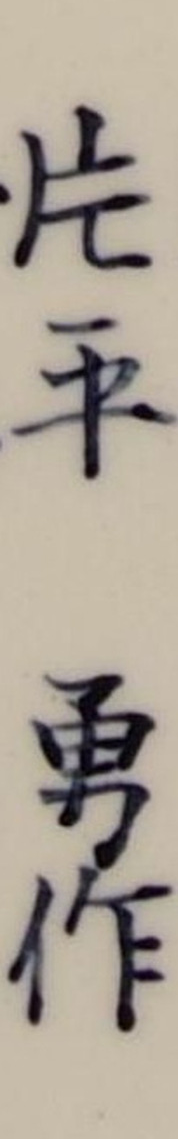片平勇作
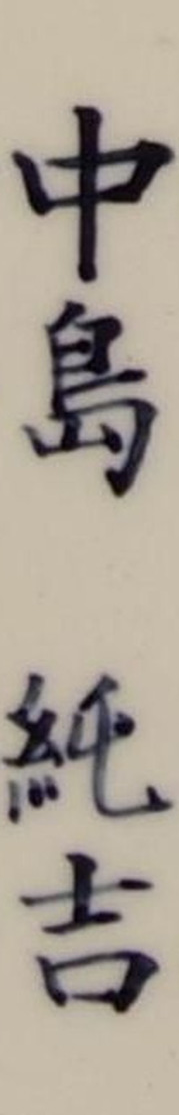中島純吉
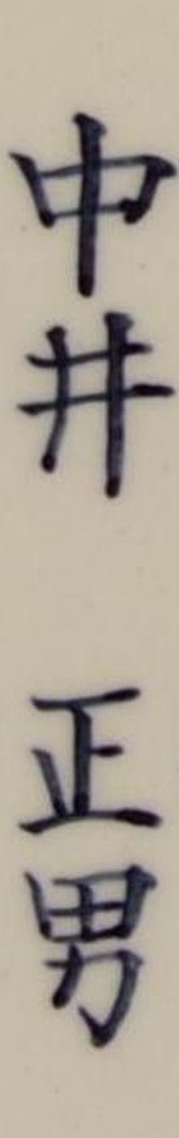中井正男
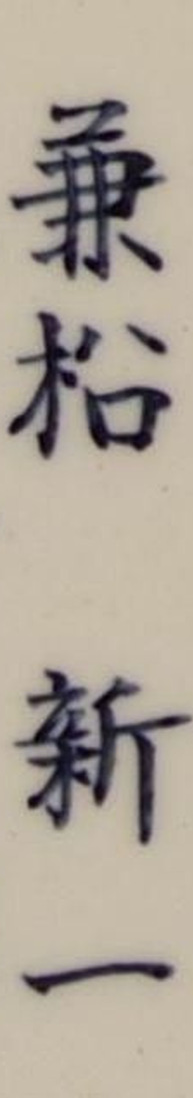兼松新一
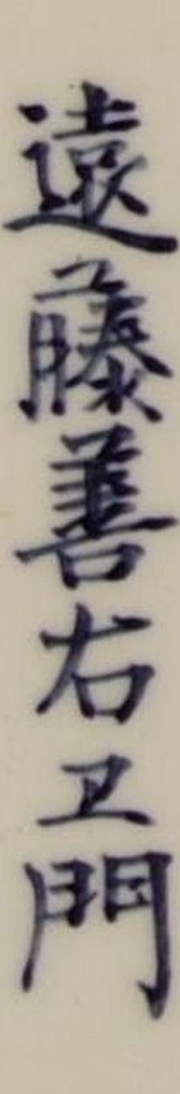遠藤善右ヱ門
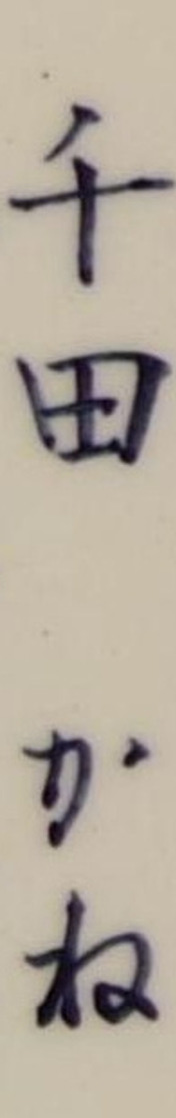千田かね
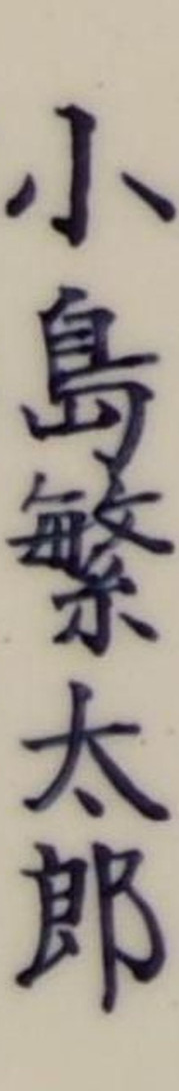小島繁太郎
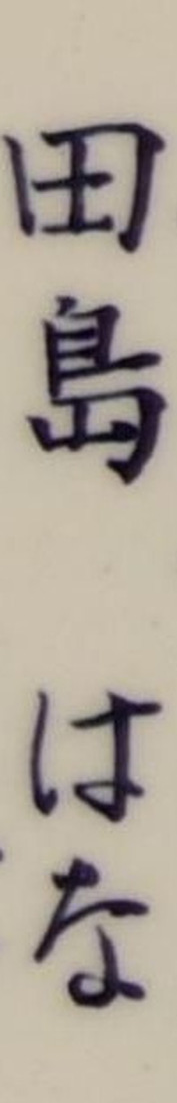田島はな

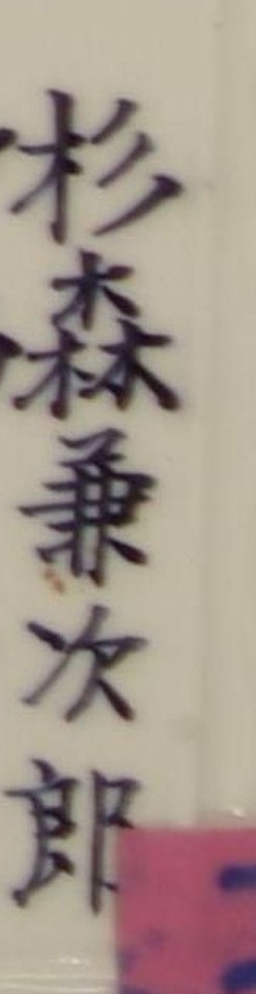杉森兼次郎
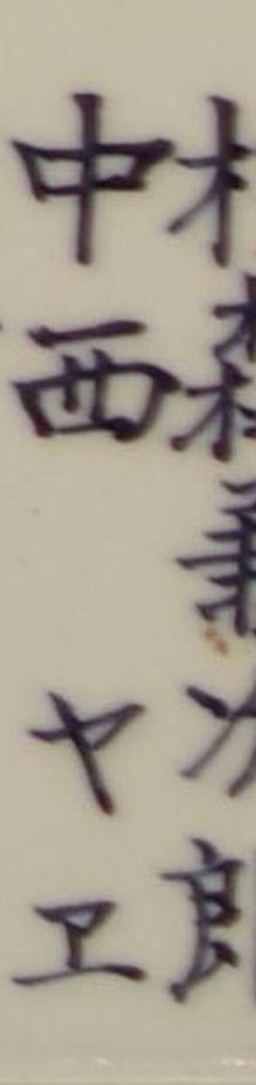中西ヤエ
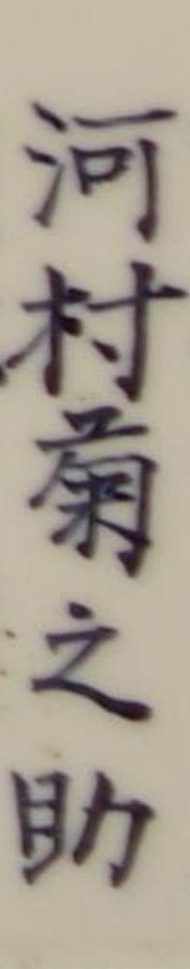河村菊之助
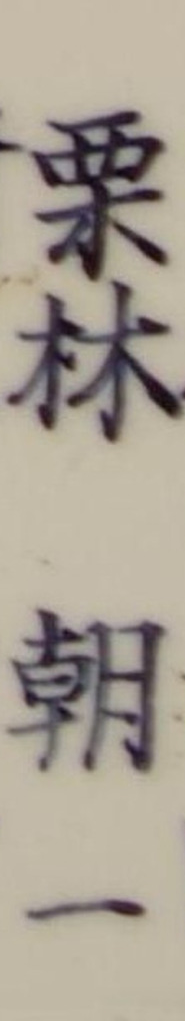栗林朝一
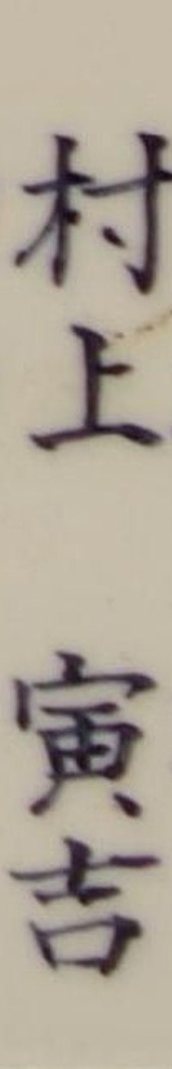村上寅吉
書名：M~S
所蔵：高野山金剛峯寺
